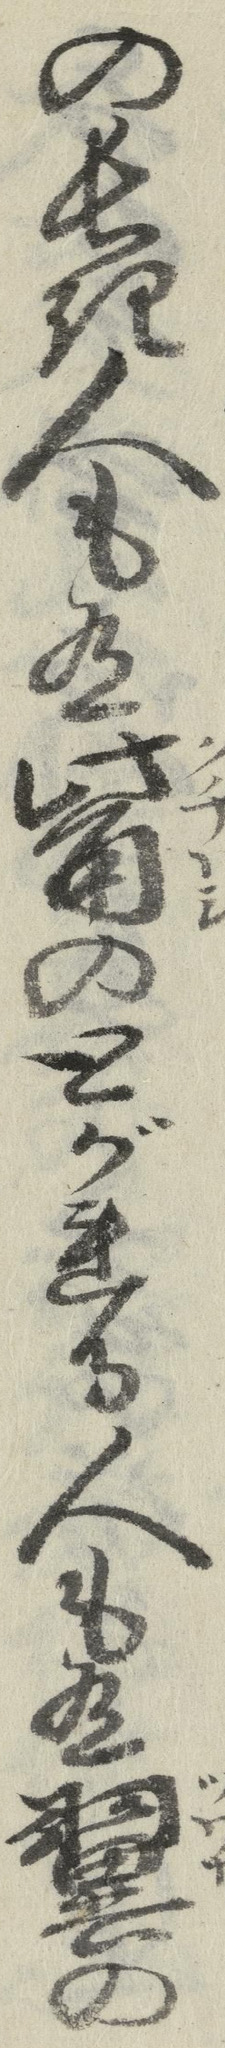の長き人も有觜のとがれる人も有翼の
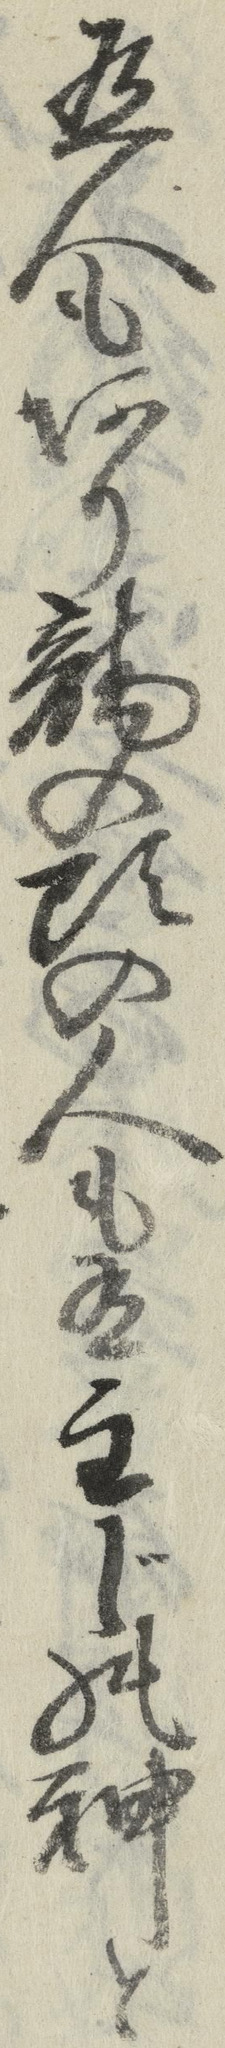有人もあり龍の頭の人も有主じの神と
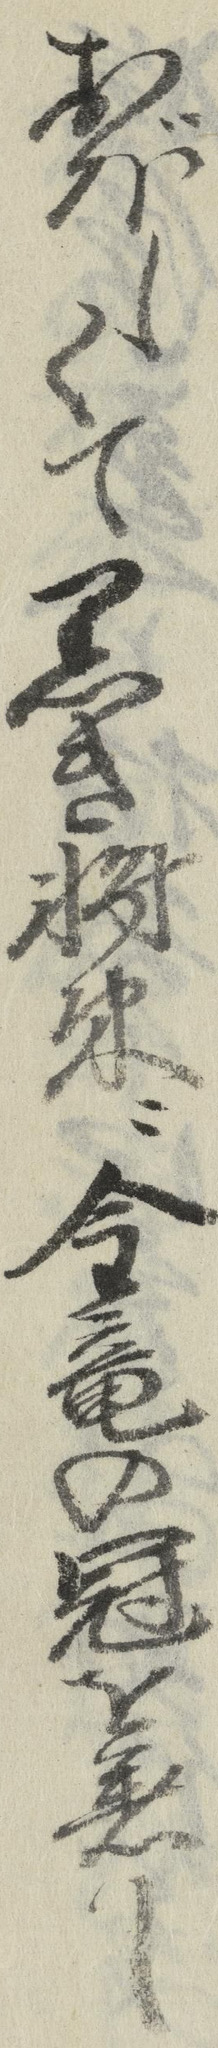おぼしくて黒き将束に金竜の冠を着し

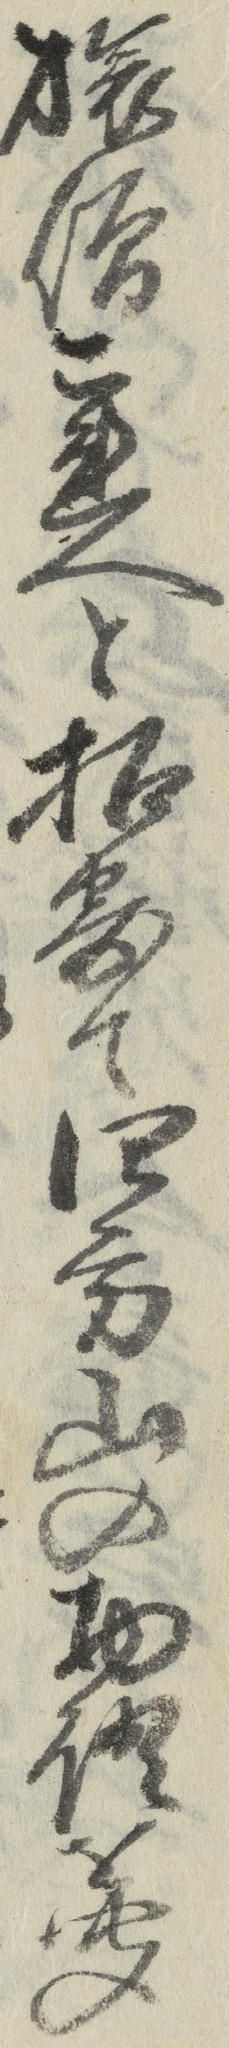旅僧これへと招寄て四方山の物語を聞
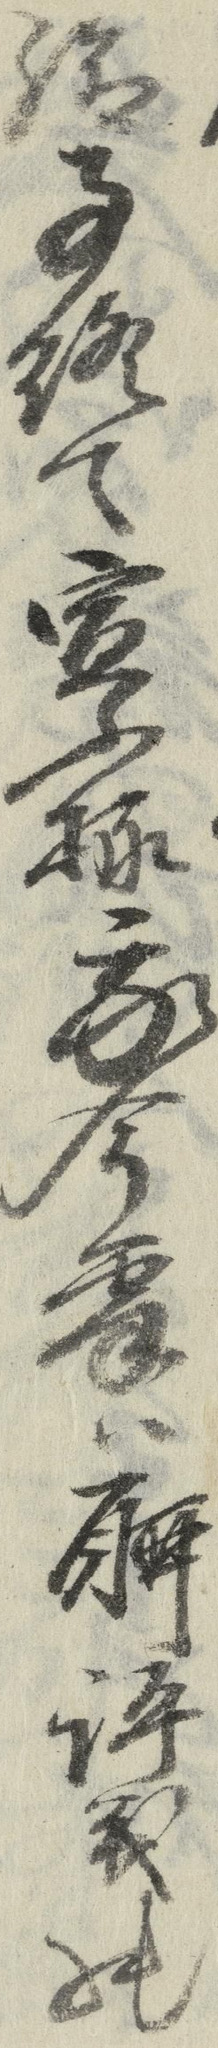給事終て宣ふ様我今宵は聊評義の
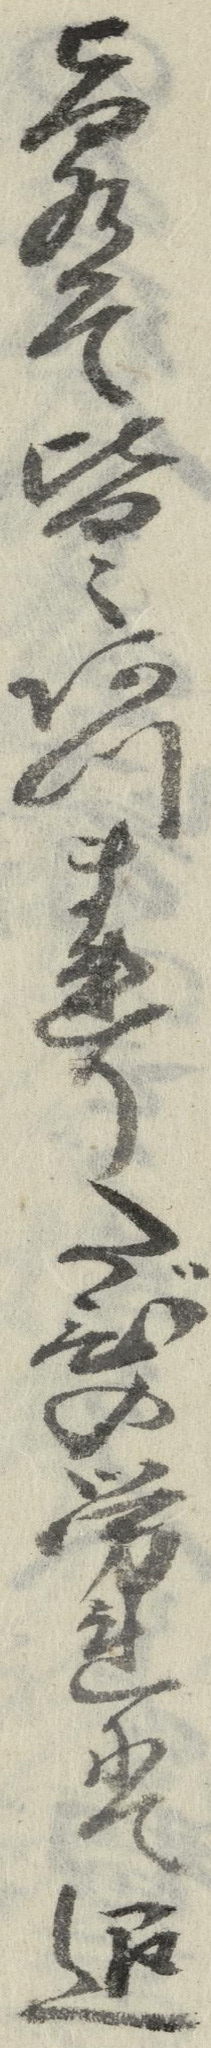旨有て皆々あつまれりたびの労れにて退
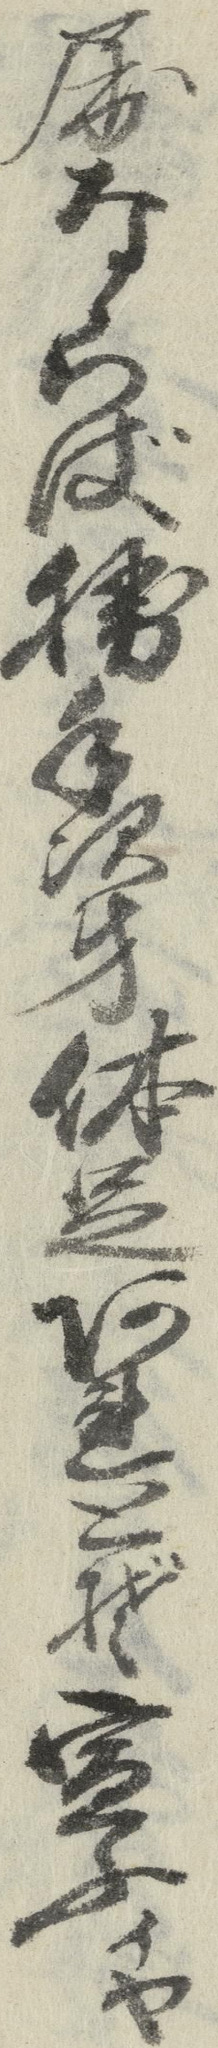屈ならば勝手次第体足あれとぞ宣ふ
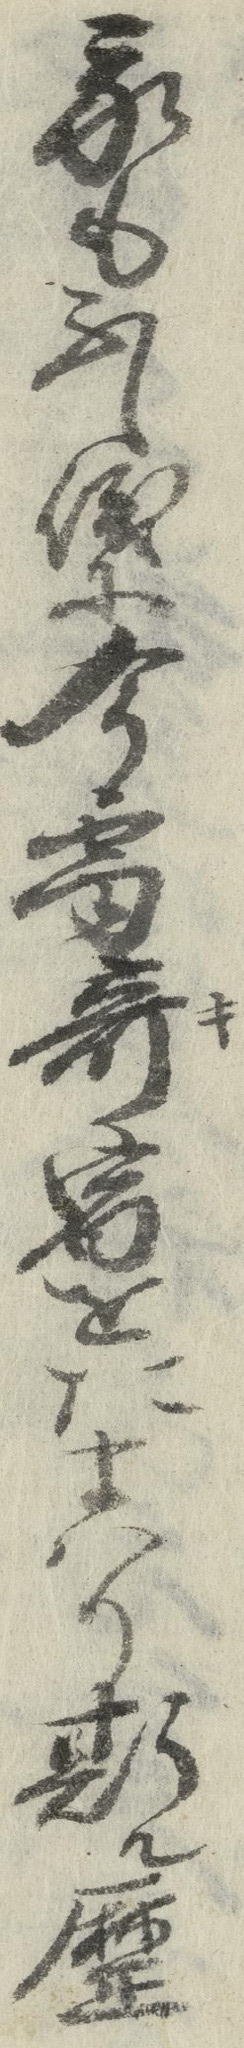我もふし儀に今当寄宿をたまはり斯歴
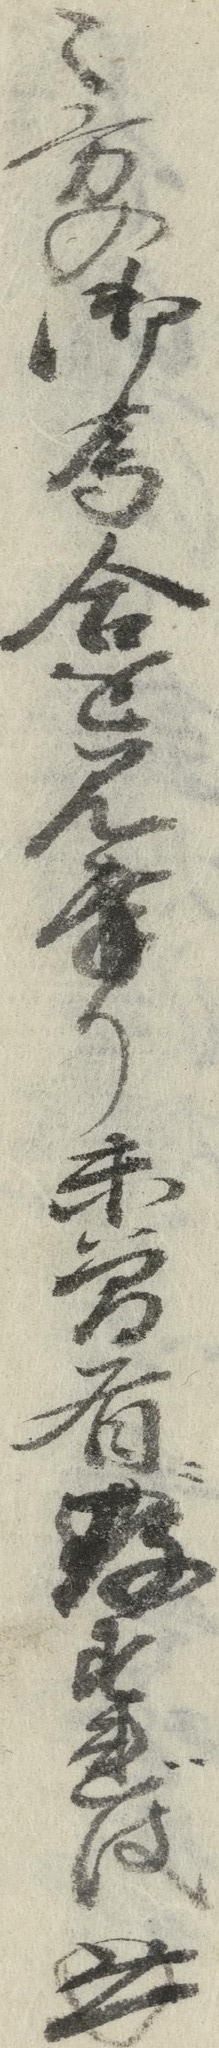々方の御会合を見奉り未曽有に存すれば
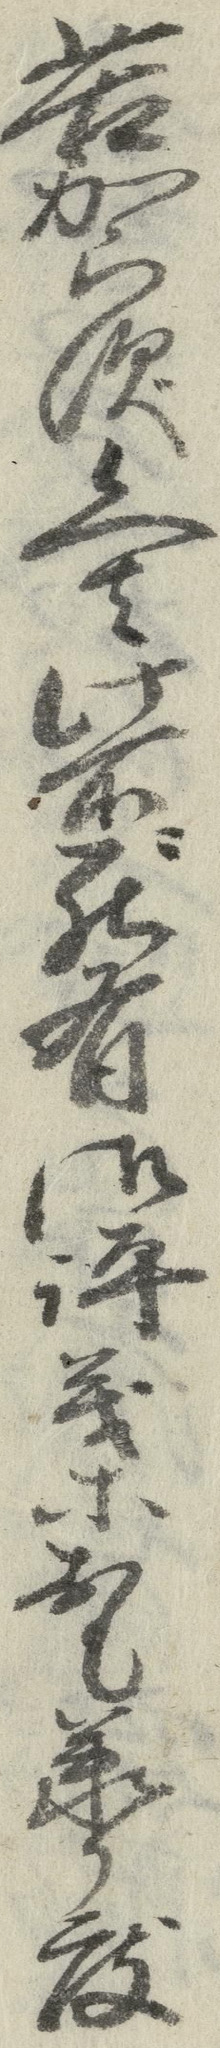苦からず候へ者此所に罷有御評義等出し承り度
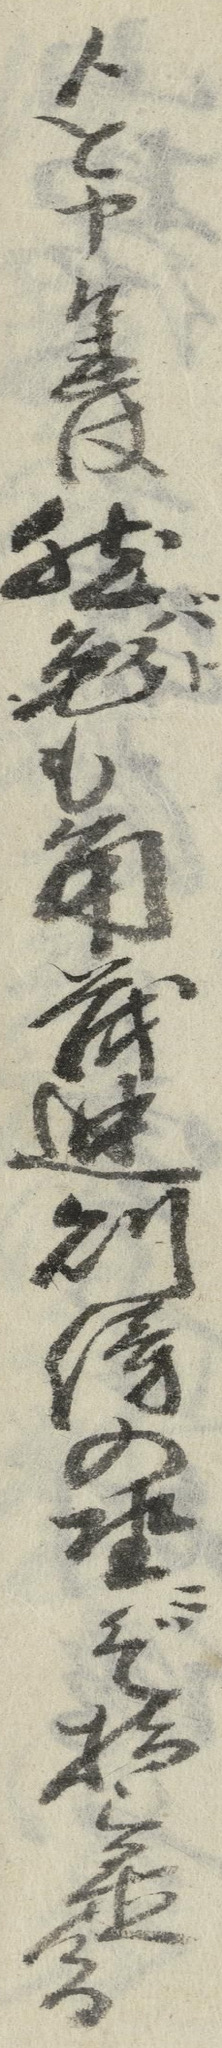候と申けれは然ば兔も角も迚則傍の坐にぞ指し置ける
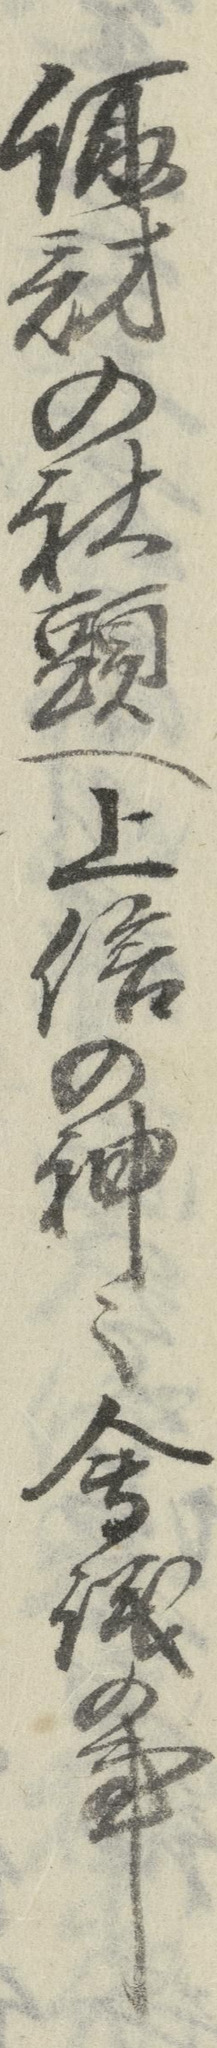諏訪の社頭へ上信の神々会議の事
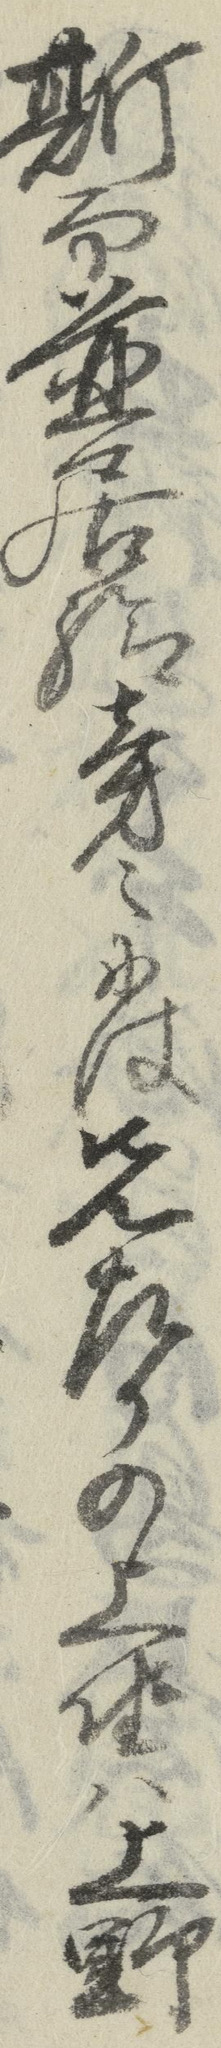斯而並居給旁々には先左りの上座は上野
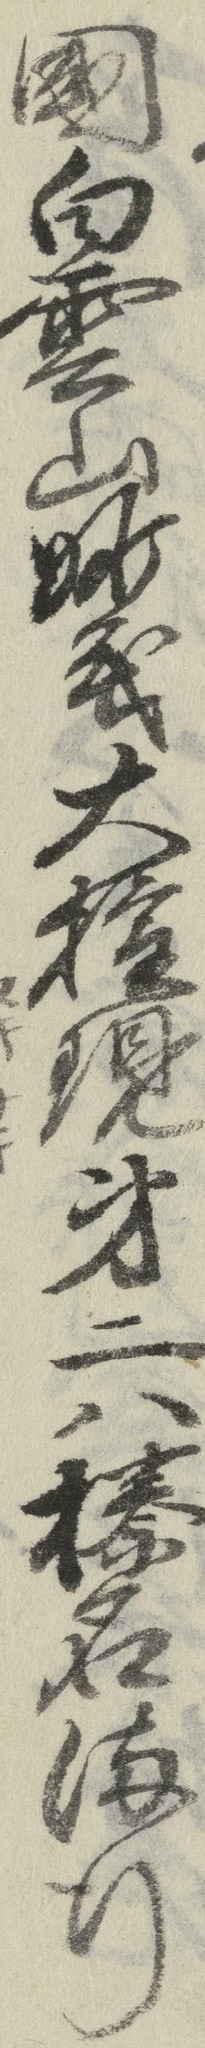国白雲山妙義大権現第ニは榛名海行
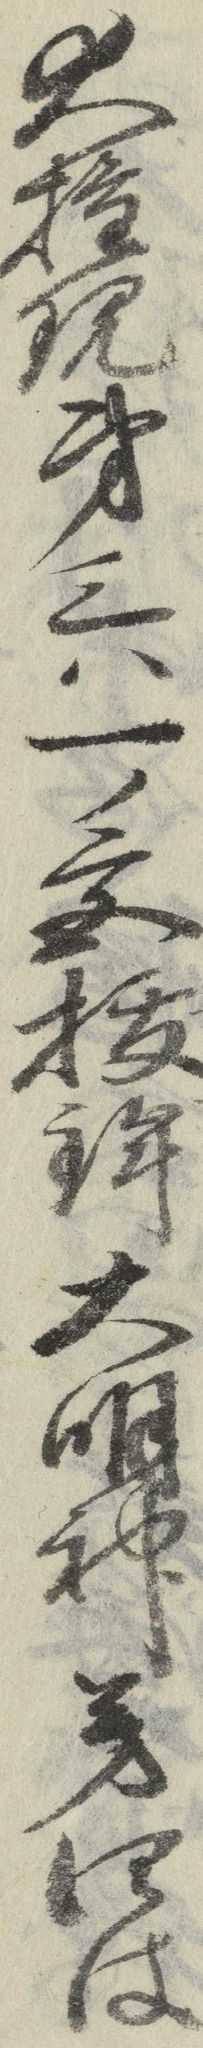大権現第三は一ノ宮抜鉾大明神第四は
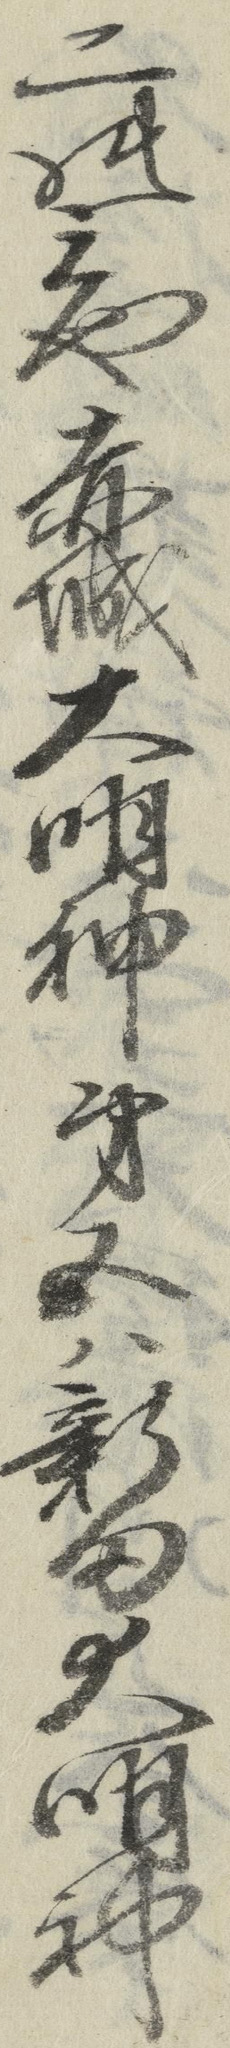二のみや赤城大明神第五は新田大明神
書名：浅間大焼騒動記　上
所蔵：東京大学地震研究所図書室 Earthquake Research Institute Library, The University of Tokyo, JAPAN
